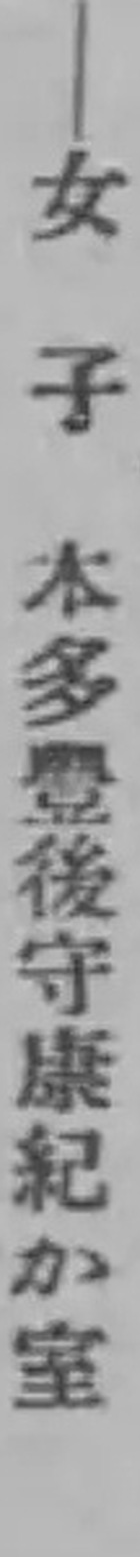女子本多豊後守康紀か室
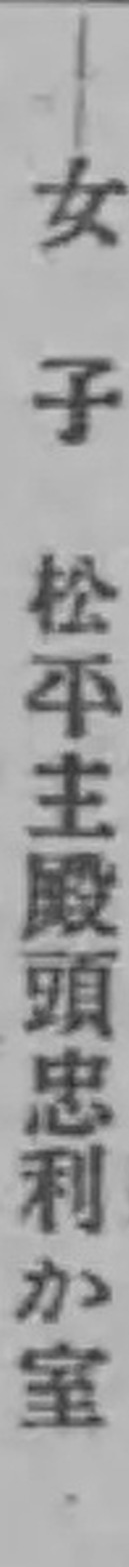女子松平主殿頭忠利か室
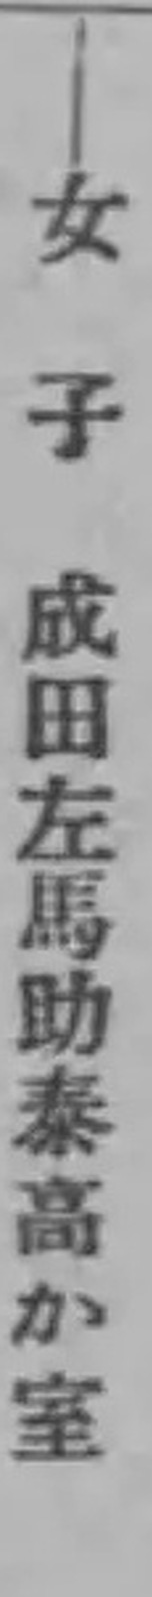女子成田左馬助泰高か室
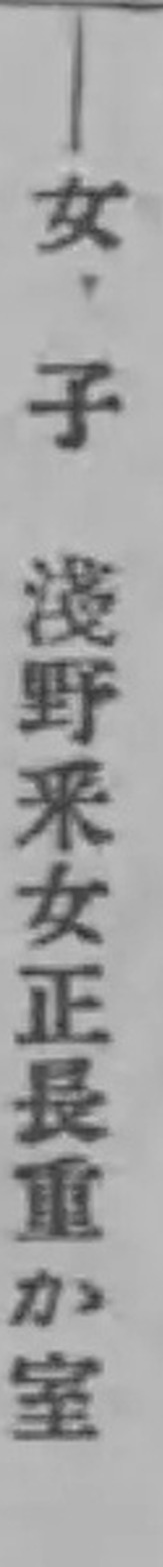女子浅野采女正長重か室
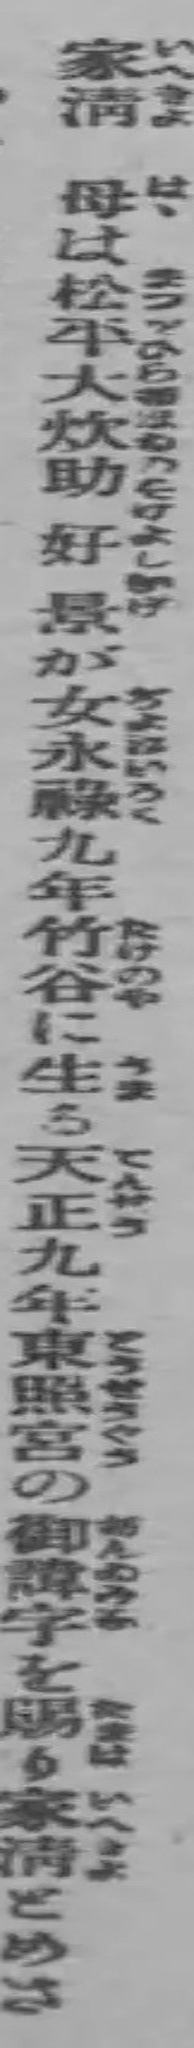家清母は松平大炊助好景が女永禄九年竹谷に生る天正九年東照宮の御諱字を賜り家清とめさ
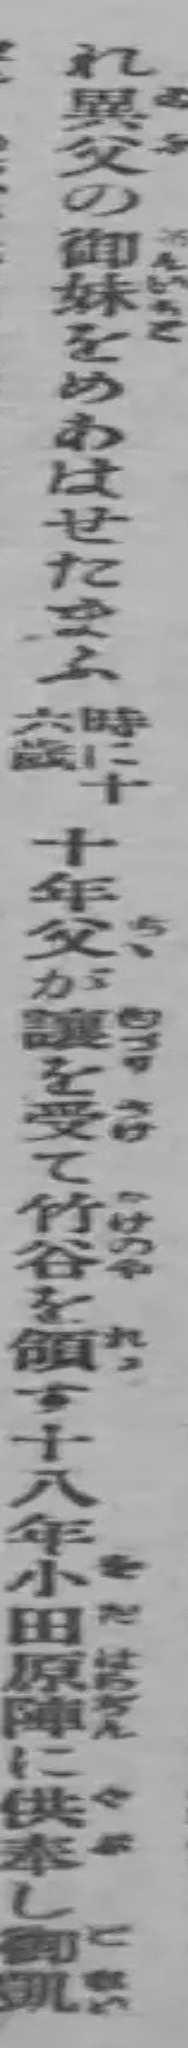れ異父の御妹をめあはせたまふ時に十六歳十年父が譲を受て竹谷を領す十八年小田原陣に供奉し御凱
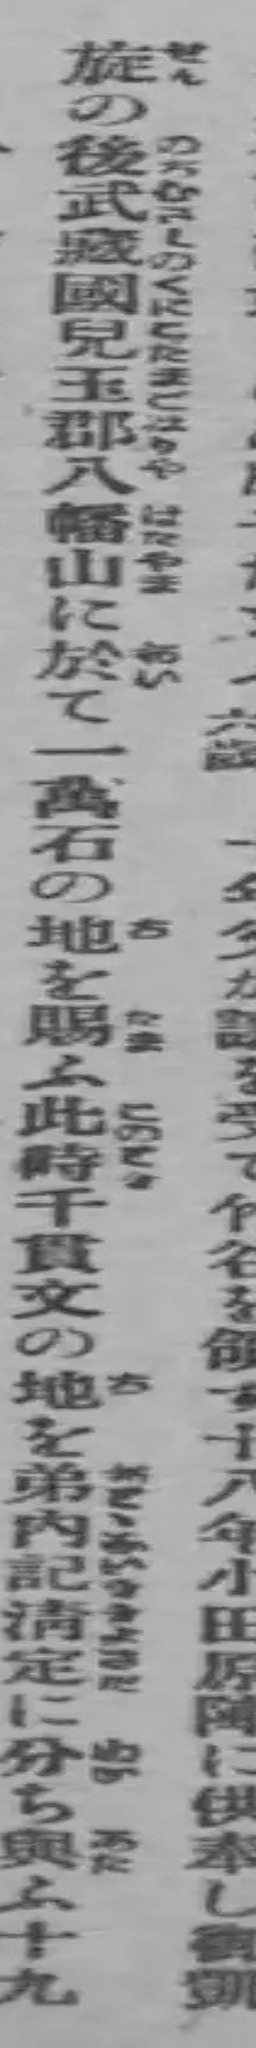旋の後武蔵国児玉郡八幡山に於て一万石の地を賜ふ此時千貫文の地を弟内記清定に分ち与ふ十九
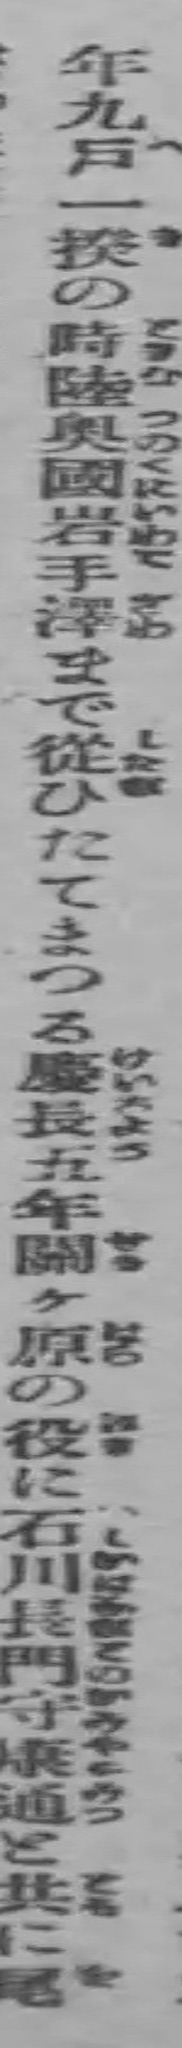年九戸一揆の時陸奥国岩手沢まで従ひたてまつる慶長五年関ヶ原の役に石川長門守康通と共に尾
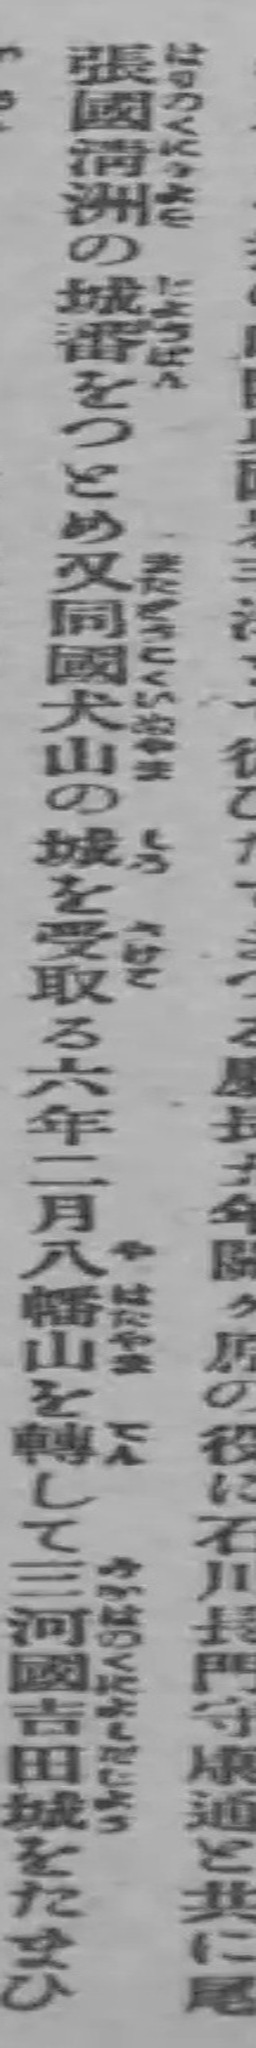張国清洲の城番をつとめ又同国犬山の城を受取る六年二月八幡山を転して三河国吉田城をたまひ
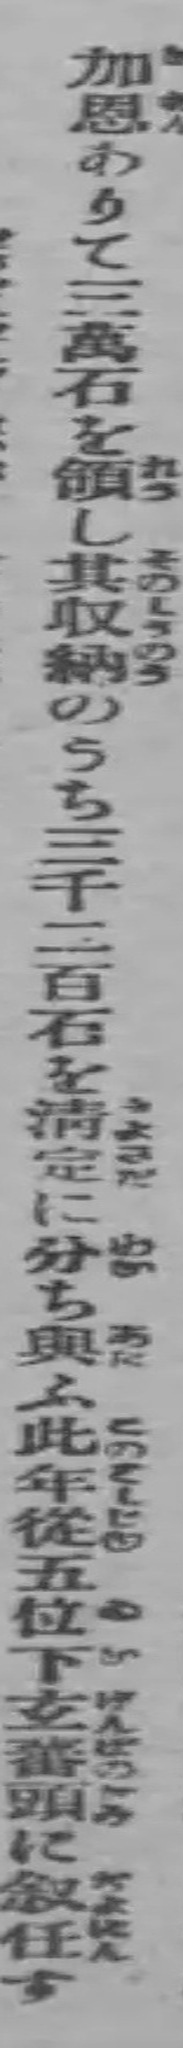加恩ありて三万石を領し其収納のうち三千二百石を清定に分ち与ふ此年従五位下玄蕃頭に叙任す
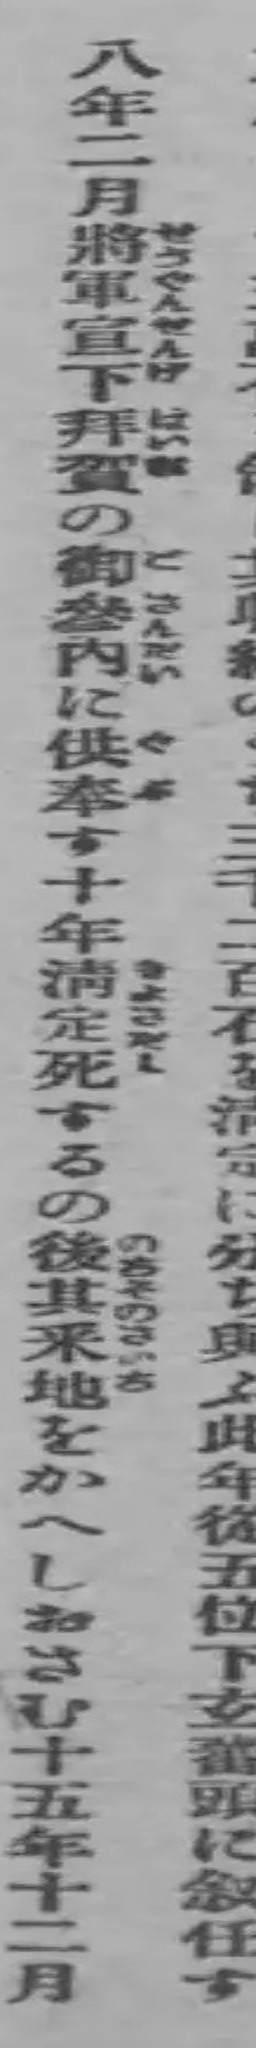八年二月将軍げはいが）の御参内に供奉す十年清定死するの後其采地をかへしおさむ十五年十二月
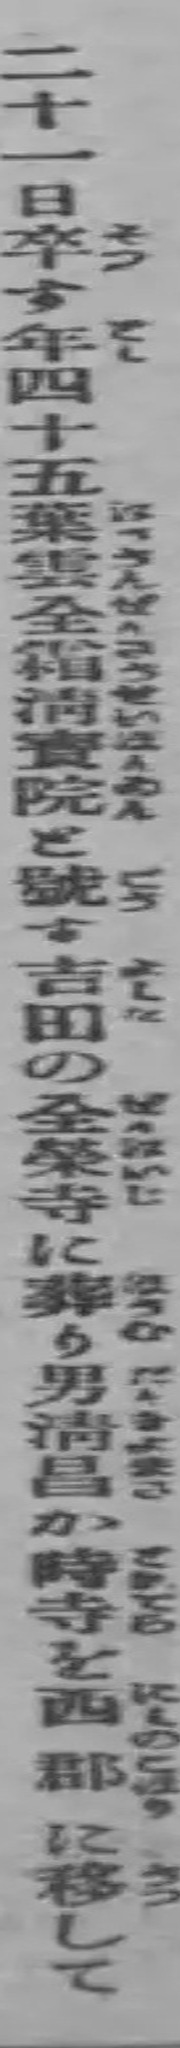二十一日卒す年四十五葉雲全霜清宝院と号す吉田の全栄寺に葬り男清昌か時寺を西郡に移して
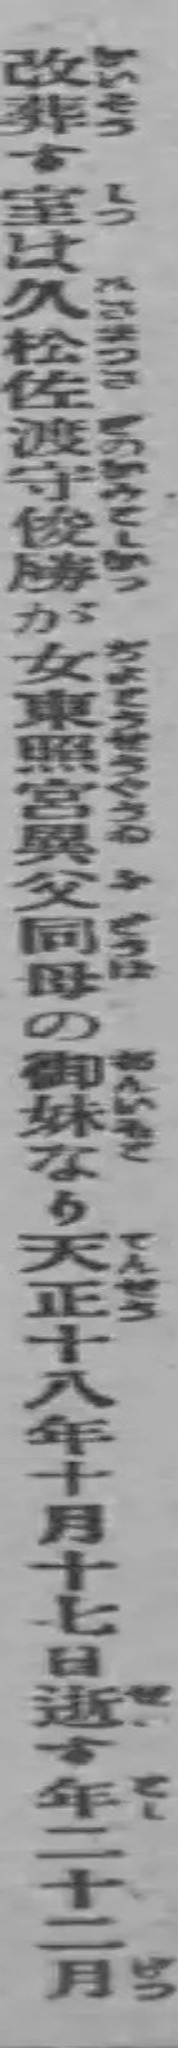改葬す室は久松佐渡守俊勝が女東照宮異父同母の御妹なり天正十八年十月十七日逝す年二十二月
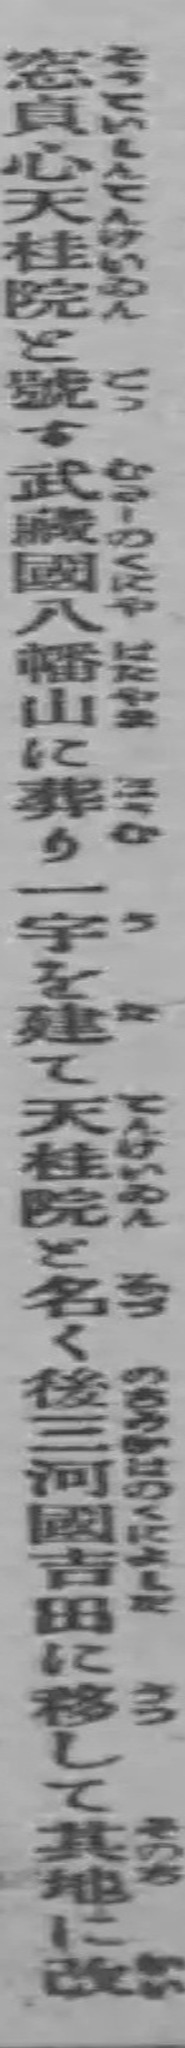窓貞心天桂院と号す武蔵国八幡山に葬り一宇を建て天桂院と名く後三河国吉田に移して其地に改
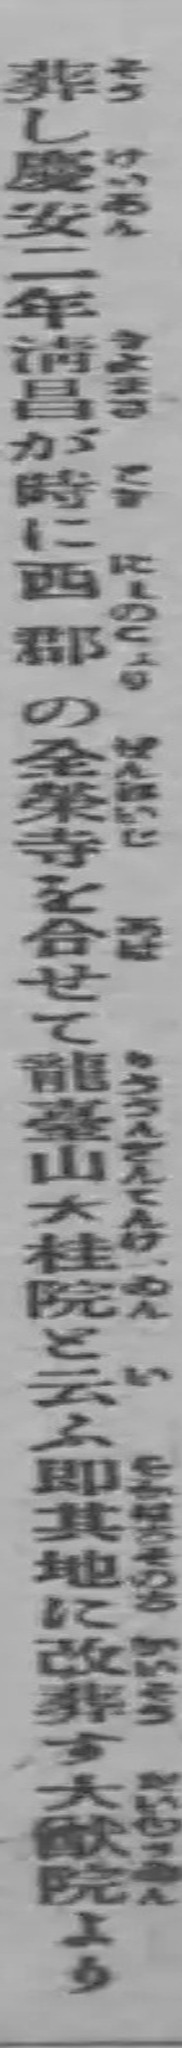葬し慶安二年清昌が時に西郡の全栄寺を合せて龍台山天桂院と云ふ即其地に改葬す大猷院より
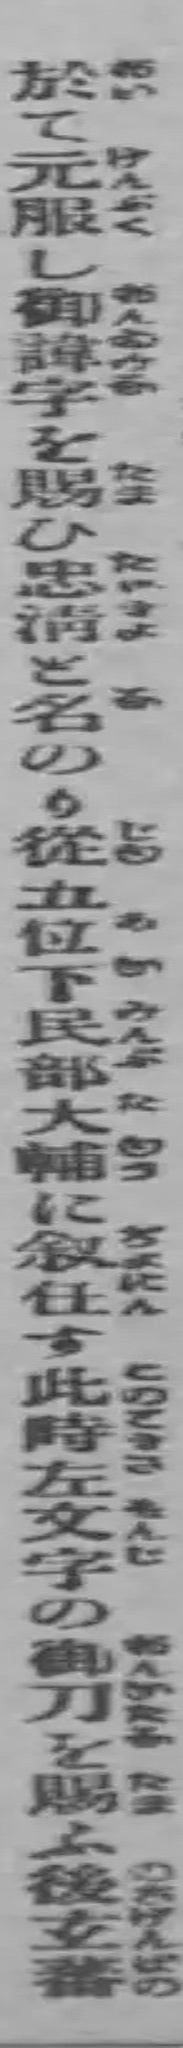於て元服し御諡字を賜ひ忠清と名のり従五位下民部大輔に叙任す此時左文字の御刀を賜ふ後玄蕃
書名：豊橋市史談
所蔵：国立国会図書館 National Diet Library, JAPAN
